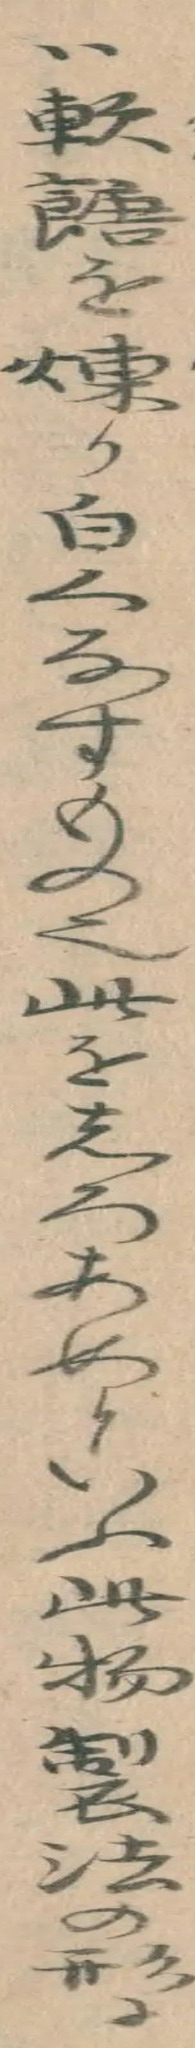は軟餹を煉り白くなすもの也此をしろあめといふ此物製法の形に

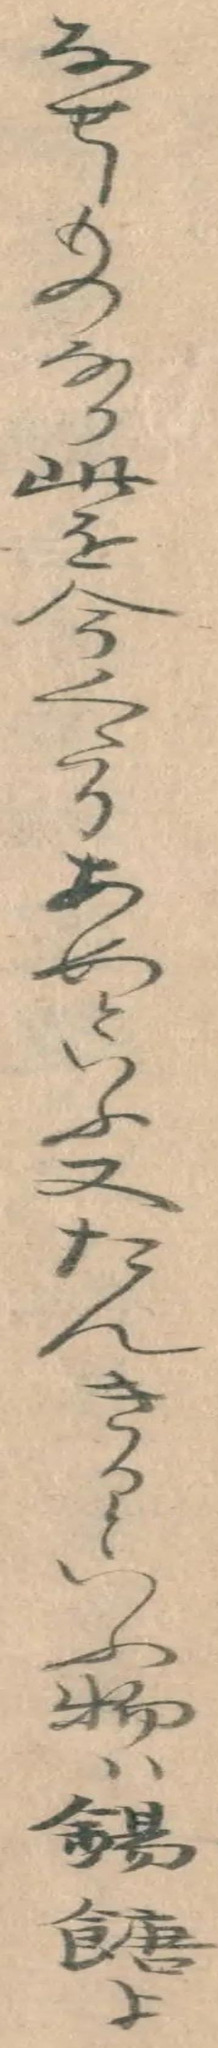なせしものなり此を今くたりあめといふ又たんきりといふ物は錫餹よ
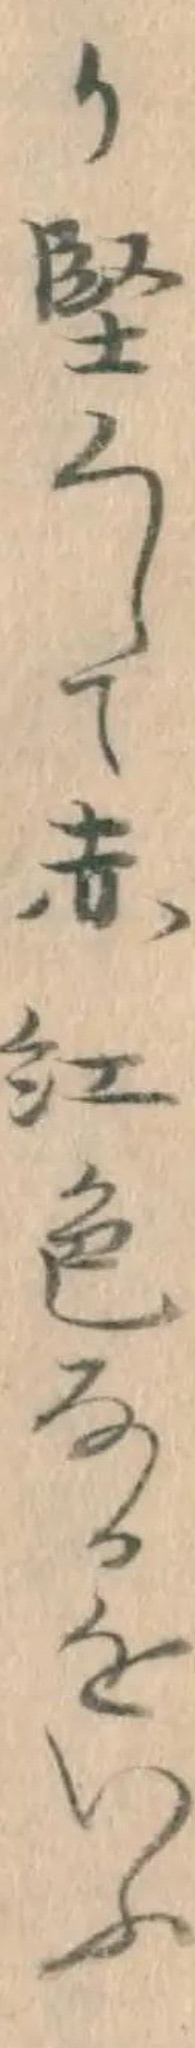り堅くして赤紅色なるをいふ
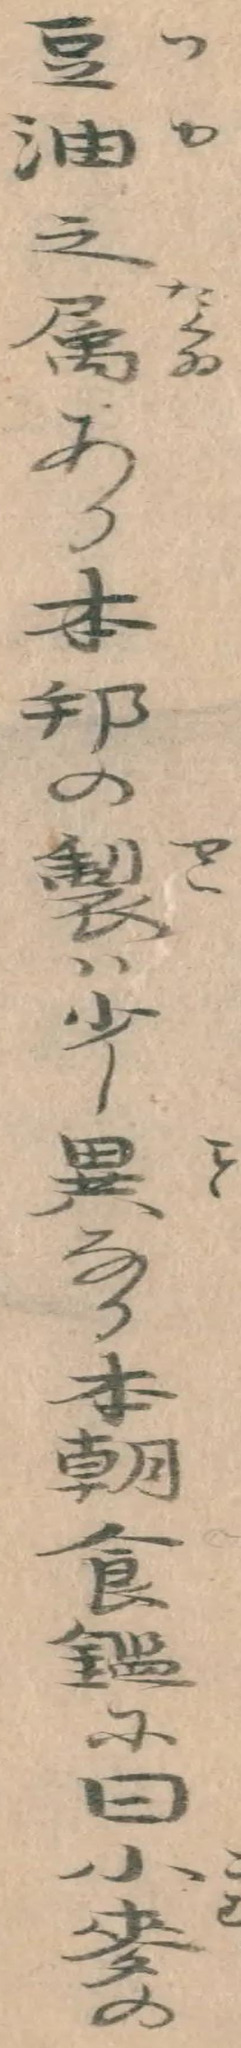豆油之属あり本邦の製は少し異なり本朝食鑑に曰小麦の
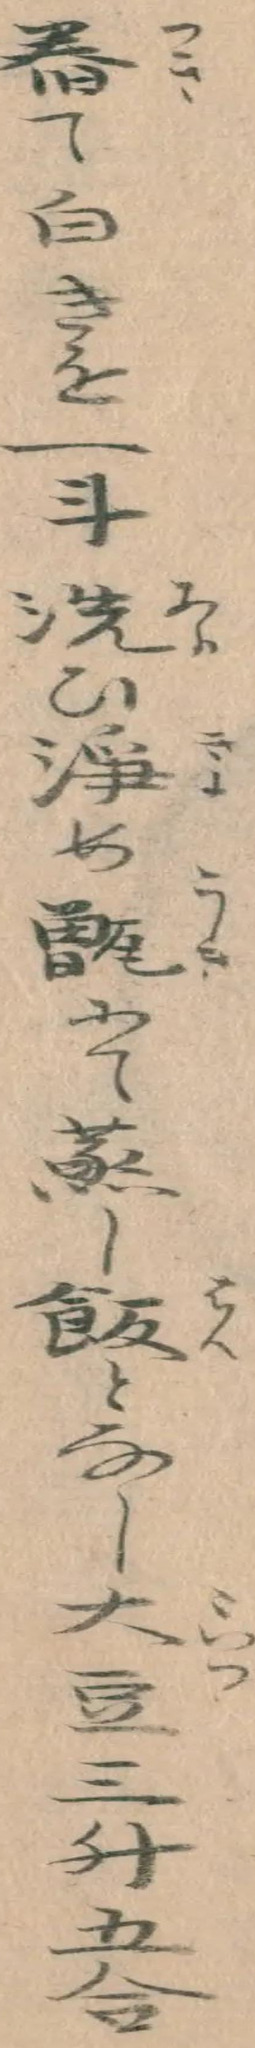舂て白きを一斗洗ひ浄め甑にて蒸し飯となし大豆三升五合
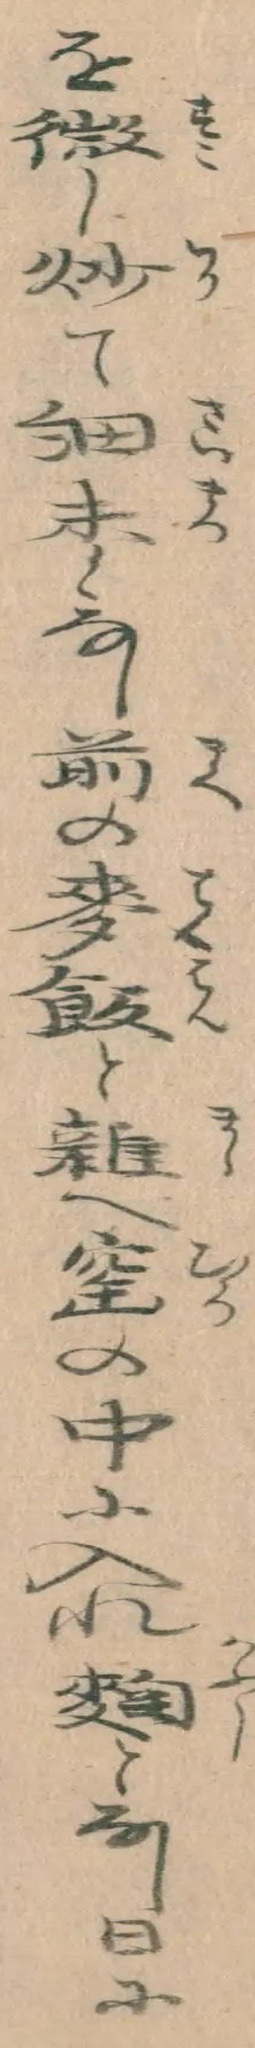を微し炒て細末となし前の麦飯と雑へ窯の中に入れ麹となし日に
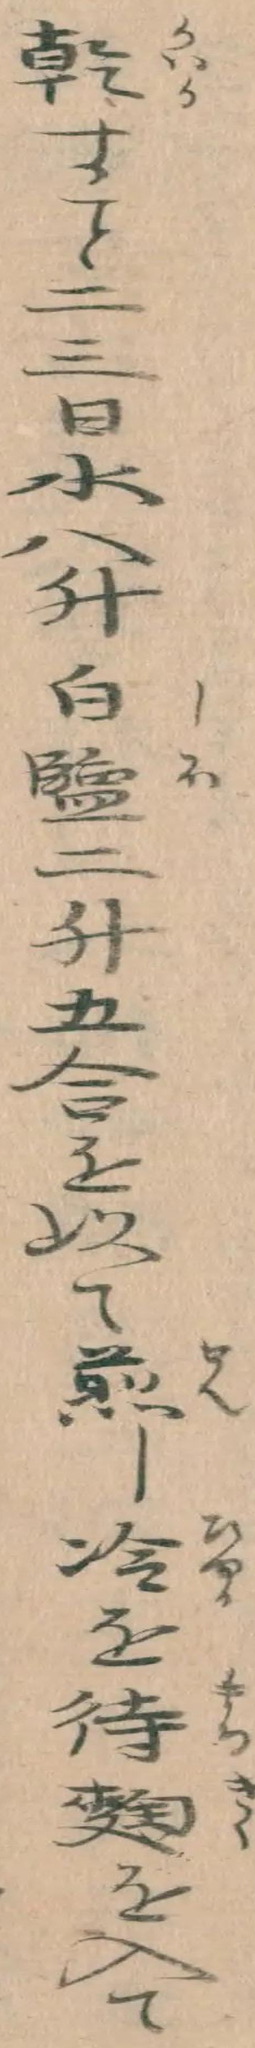乾すを二三日水八升白塩二升五合を以て煎し冷を待麹を入て
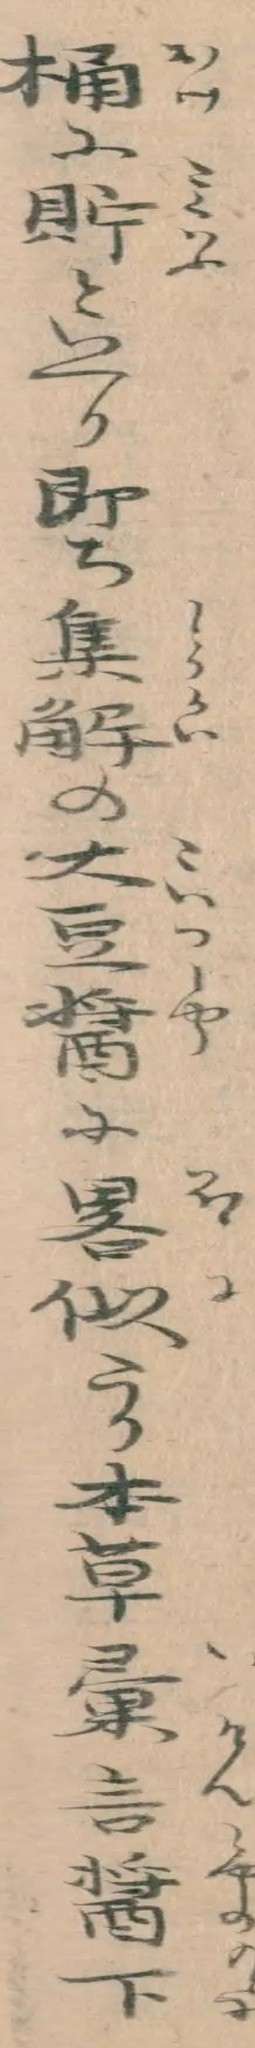桶に貯といへり即ち集解の大豆醤に略似たり本草彙言醤下
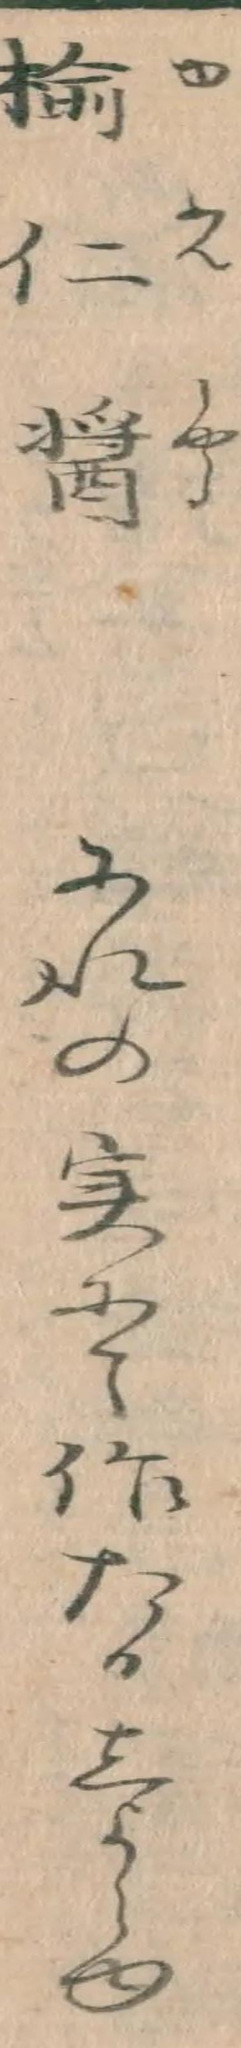楡仁醤にれの実にて作たるしようゆ
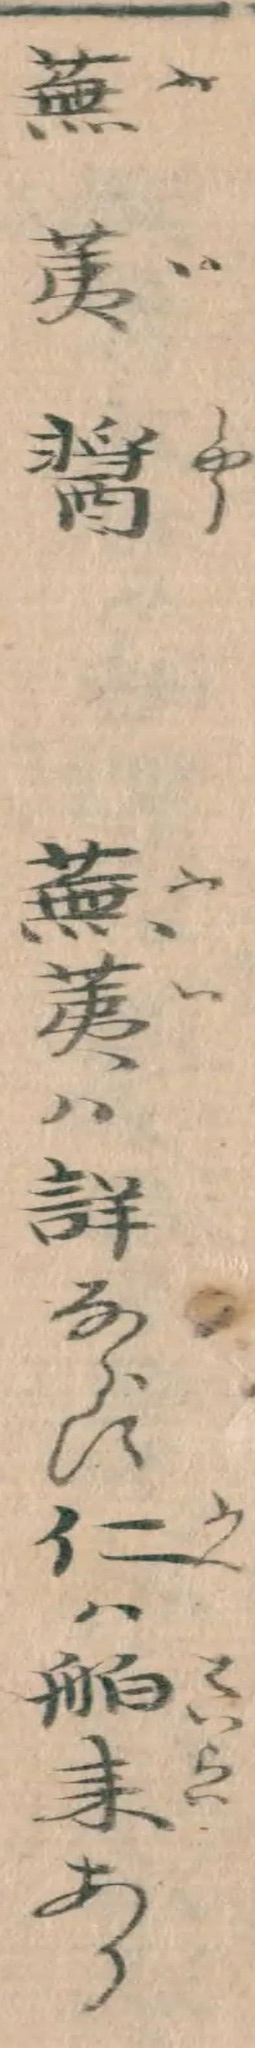蕪荑醤蕪荑は詳ならす仁は舶来あり
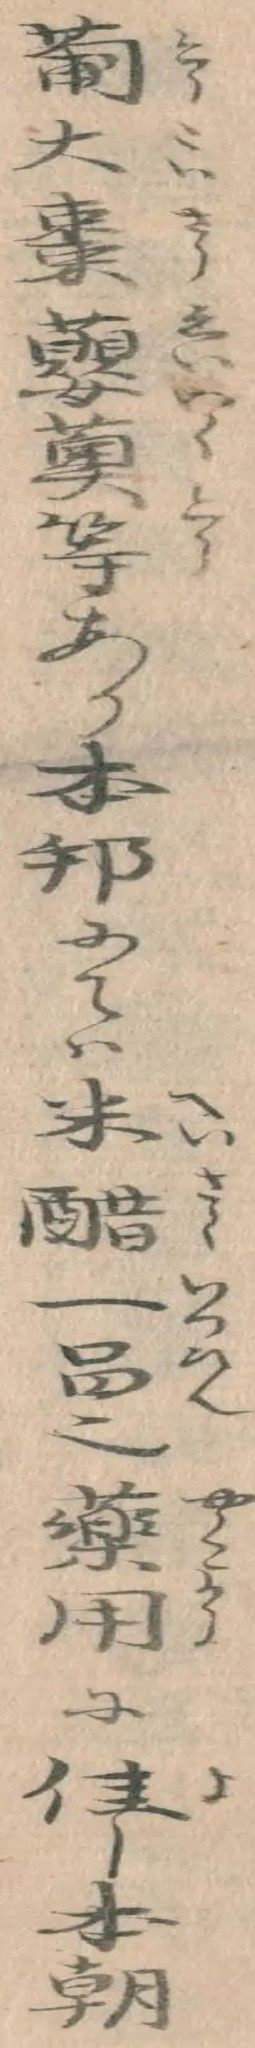葡大棗蘡薁等あり本邦にては米醋一品也薬用に佳し本朝
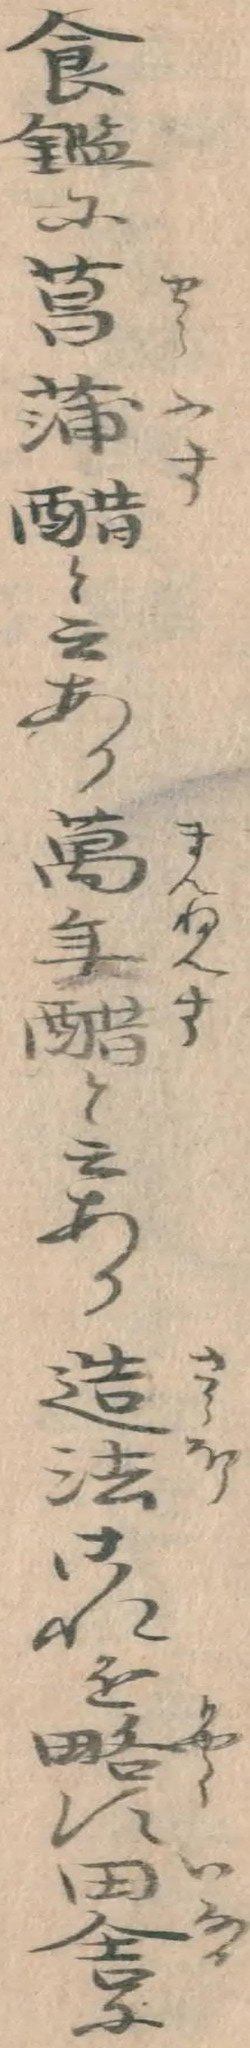食鑑に菖蒲醋と云あり万年醋と云あり造法これを略す田舎に
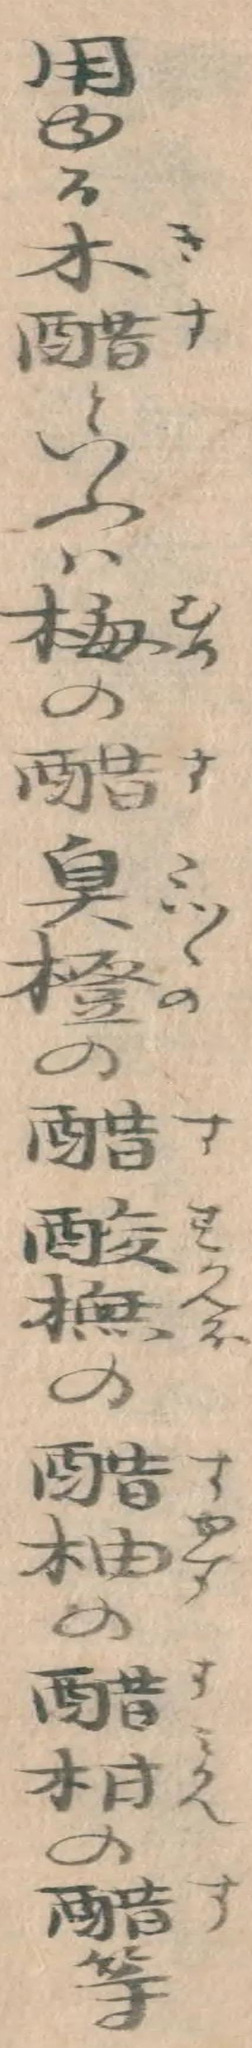用ゆる木醋といふは梅の醋臭橙の醋酸模の醋柚の醋柑の醋等
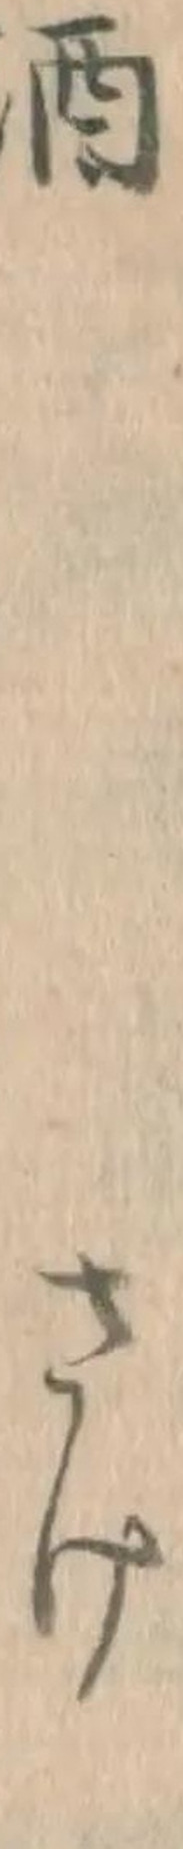酒さけ

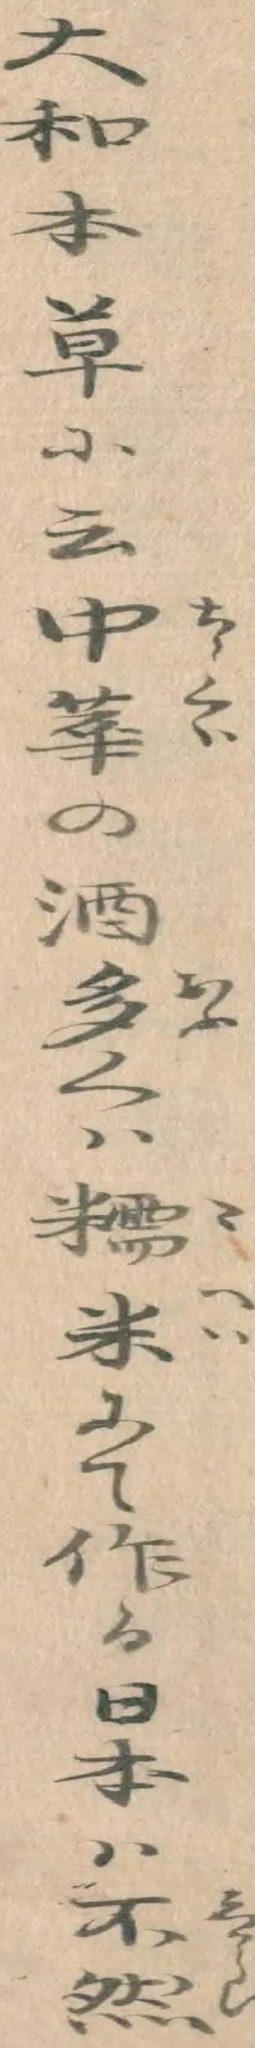大和本草に云中華の酒多くは糯米にて作る日本は不然
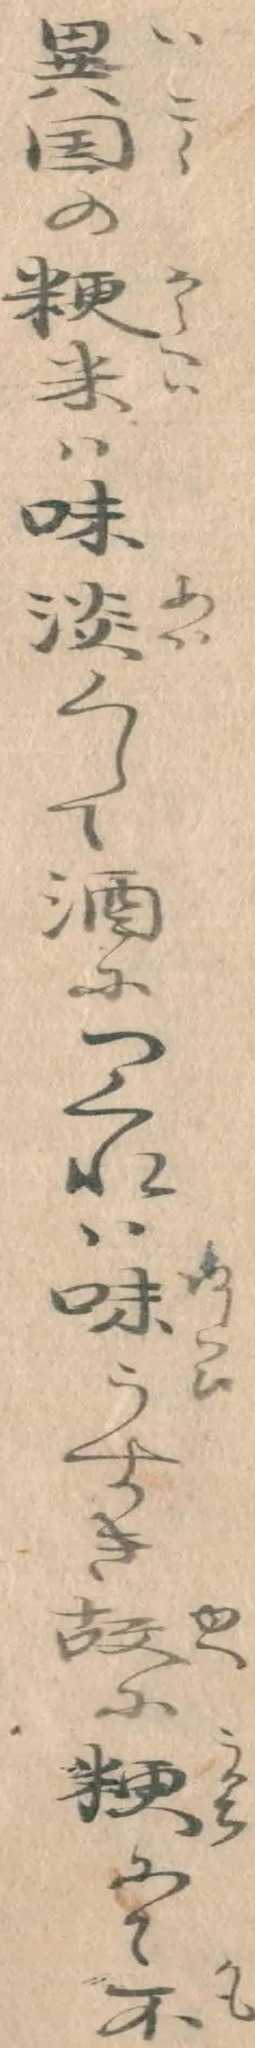異国の粳米は味淡くして酒につくれは味うすき故に粳にて不
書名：本草図譜. 巻43-45
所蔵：国立国会図書館 National Diet Library, JAPAN
